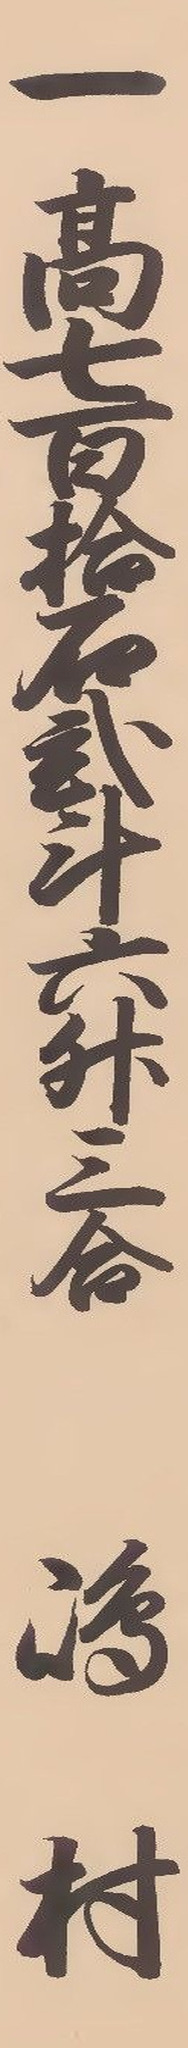一高七百拾石弐斗六升三合嶋村
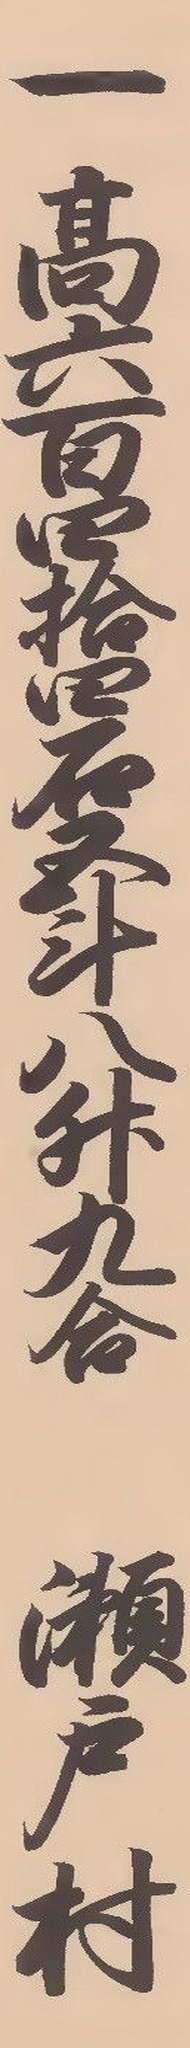一高六百四拾四石五斗八升九合瀬戸村
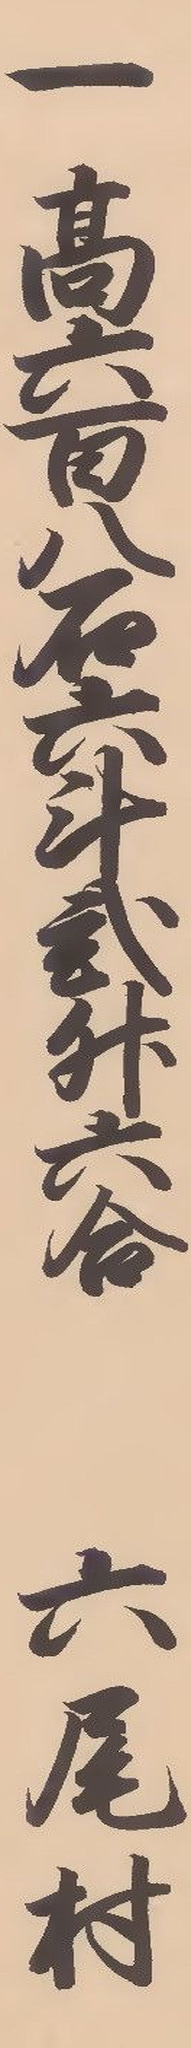一高六百八石六斗弐升六合六尾村

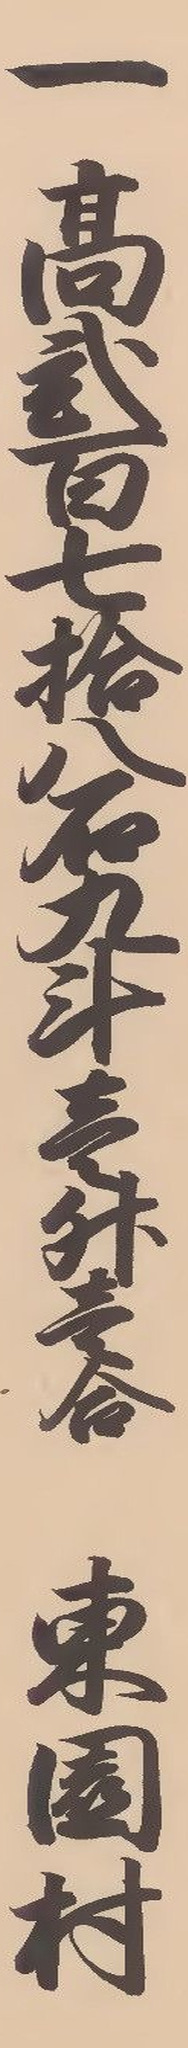一高弐百七拾八石九斗壱升壱合東園村
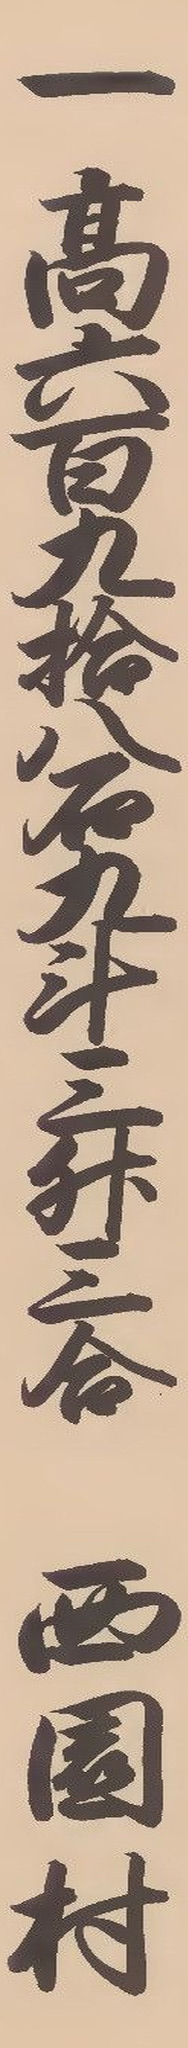一高六百九拾八石九斗三升三合西園村
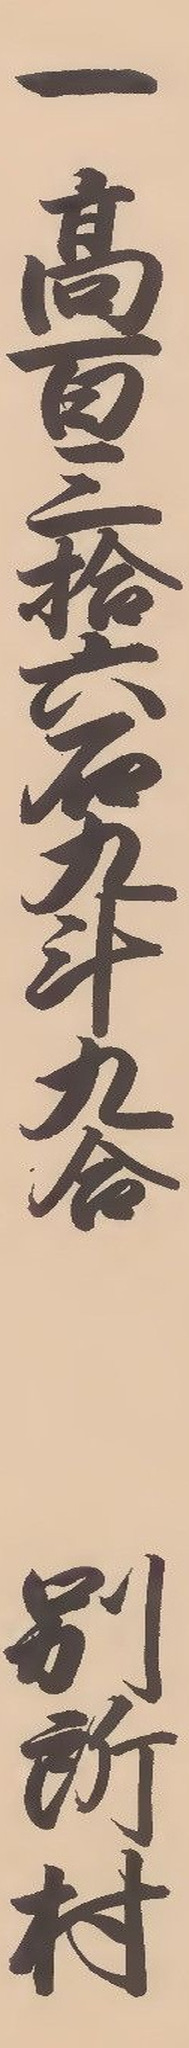一高百三拾六石九斗九合別所村
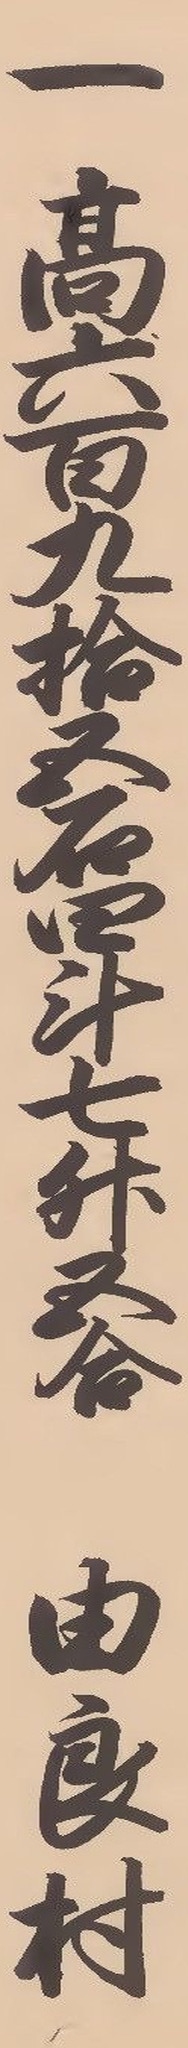一高六百九拾五石四斗七升五合由良村
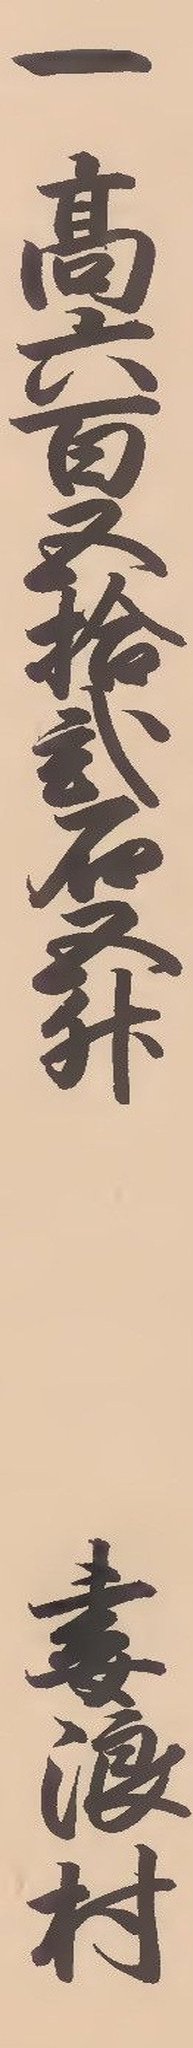一高六百五拾弐石五升妻浪村
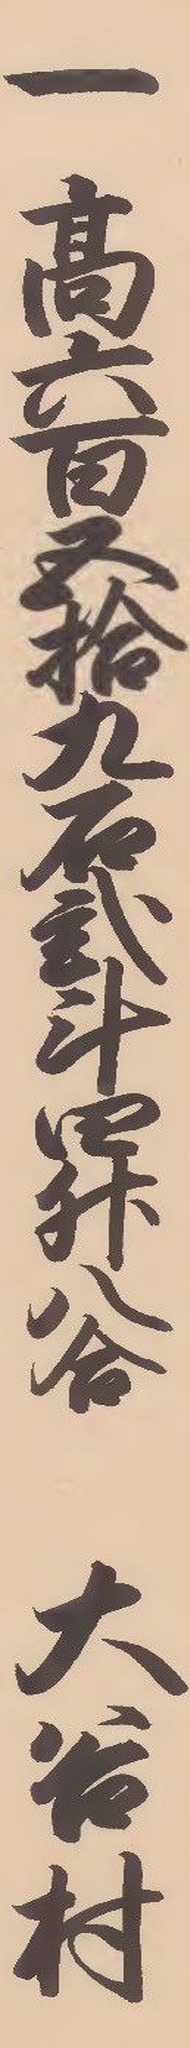一高六百五拾九石弐斗四升八合大谷村
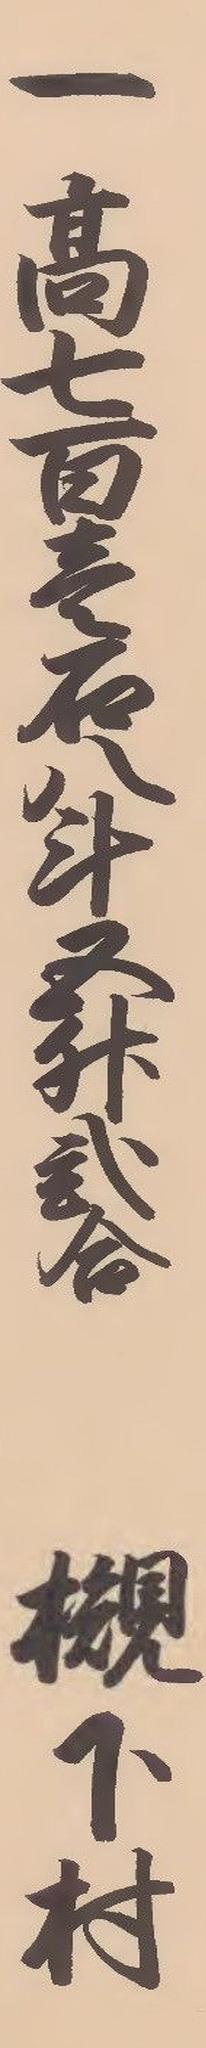一高七百壱石八斗五升弐合槻下村
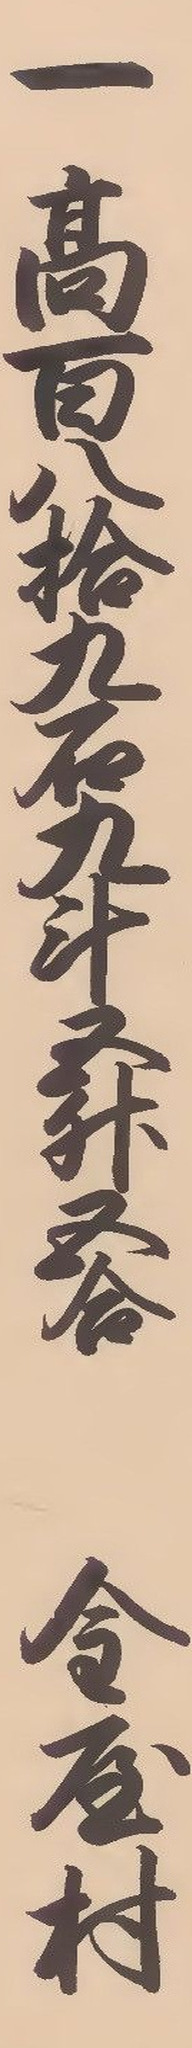一高百八拾九石九斗五升五合金屋村

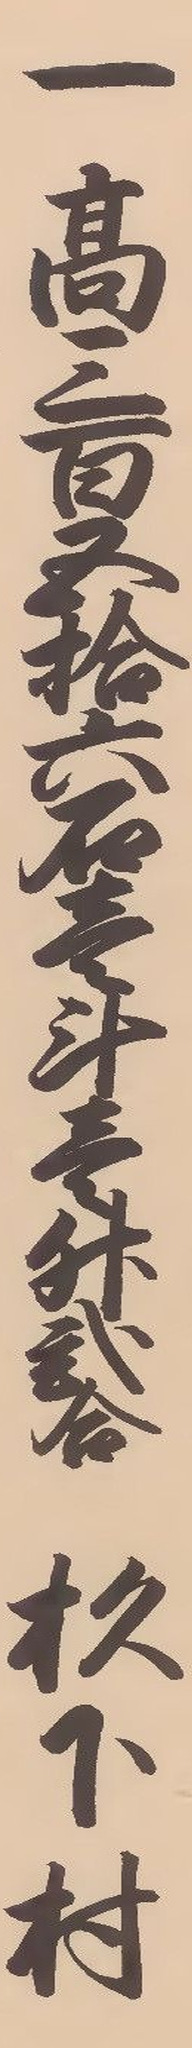一高三百五拾六石壱斗壱升弐合杉下村
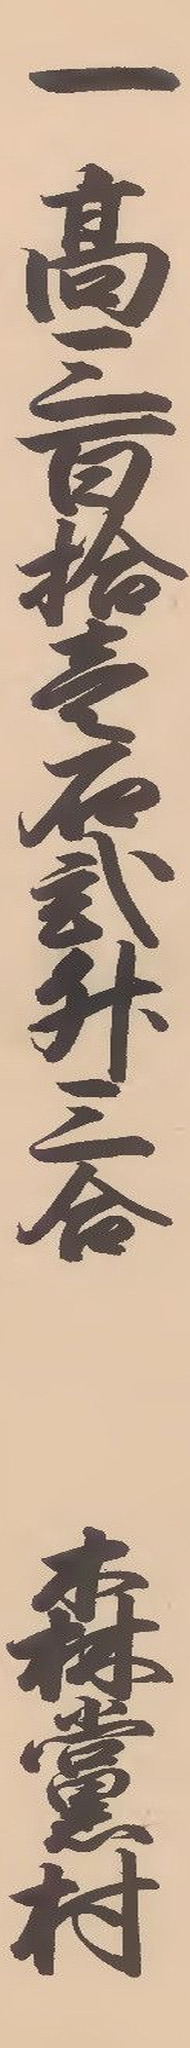一高三百拾壱石弐升三合森党村
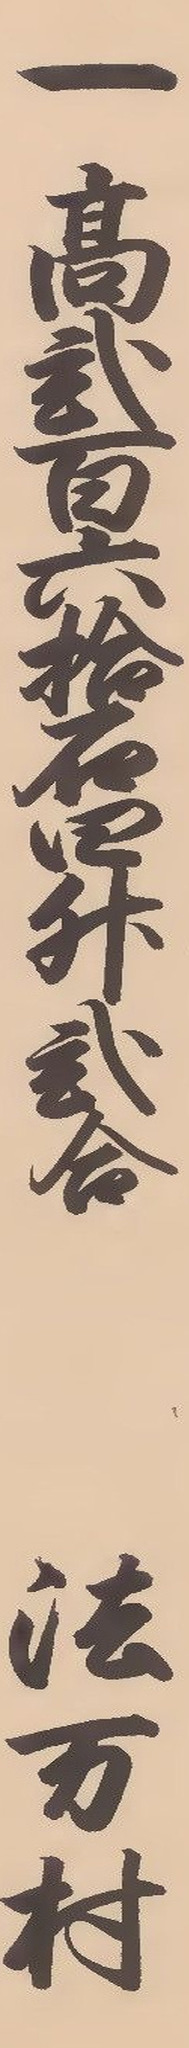一高弐百六拾石四升弐合法万村
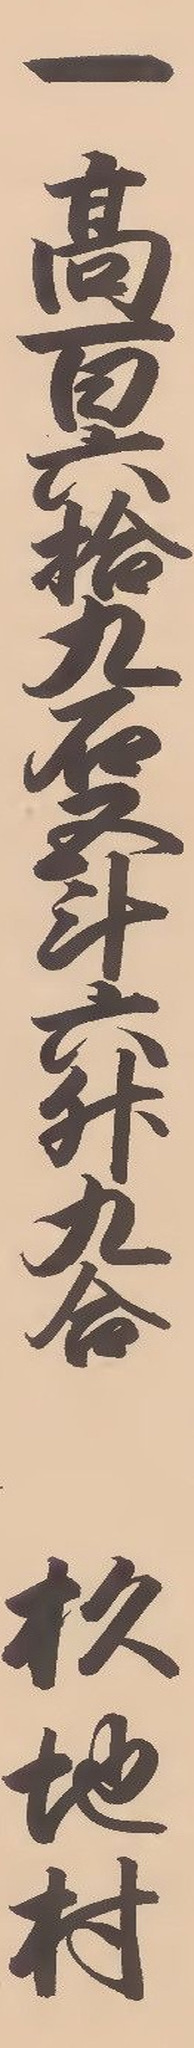一高百六拾九石五斗六升九合杉地村
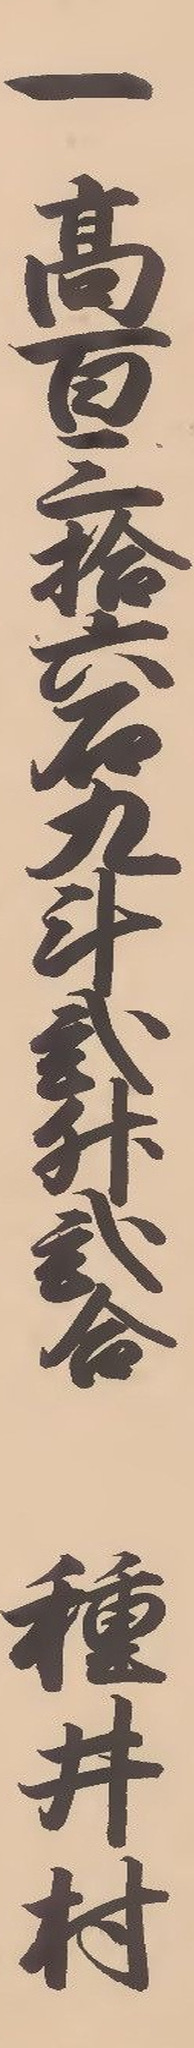一高百三拾六石九斗弐升弐合種井村
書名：伯耆国郷帳
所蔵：国立公文書館 National Archives of Japan
